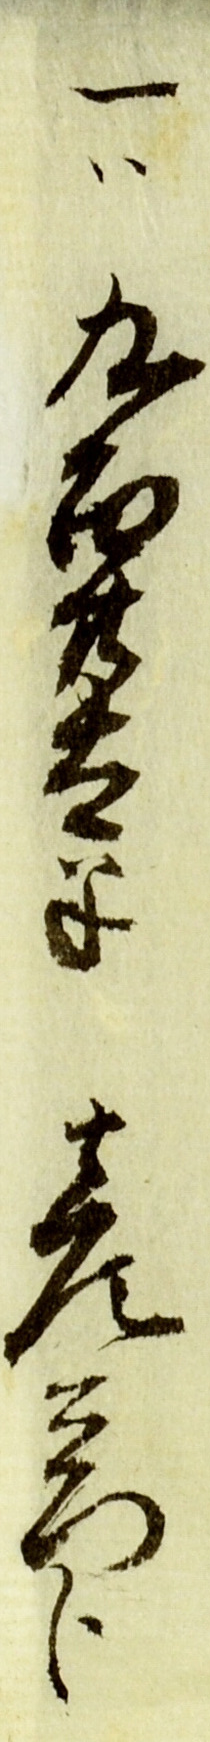一同九百廿太半彦右衛門分
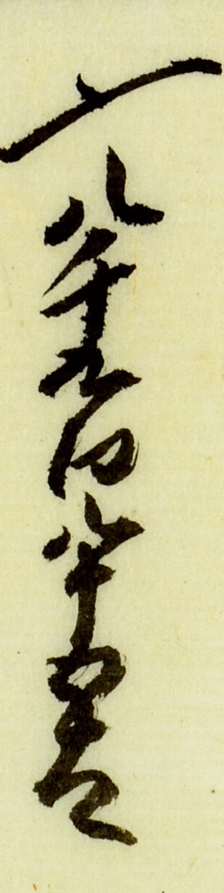〆八千九百八十五太
